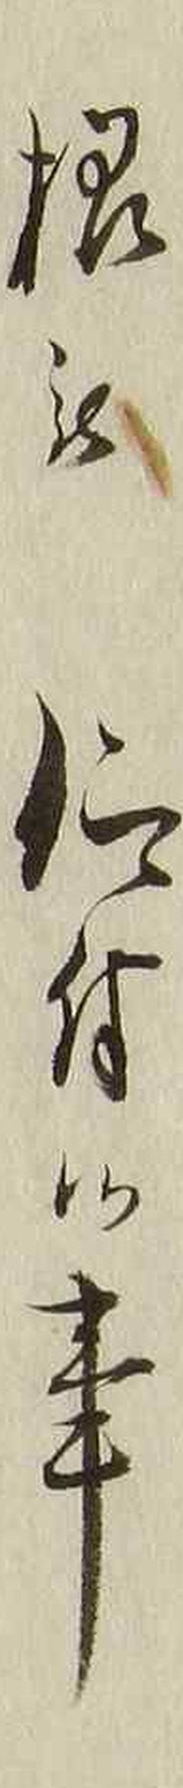様被仰付候事
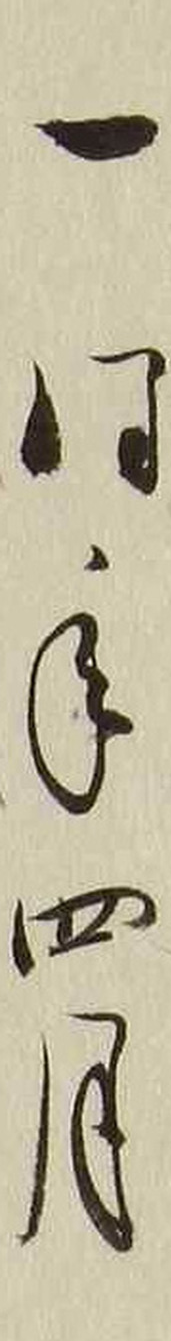一同年四月
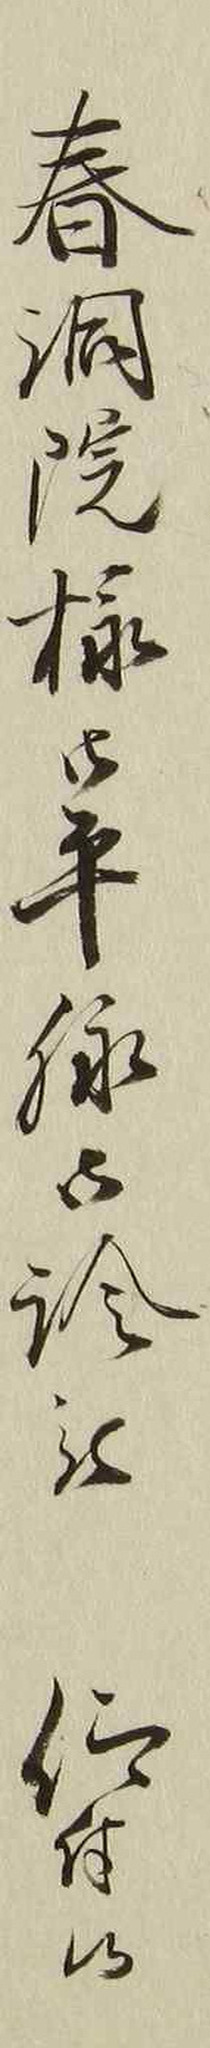春洞院様御平脈御診被仰付候
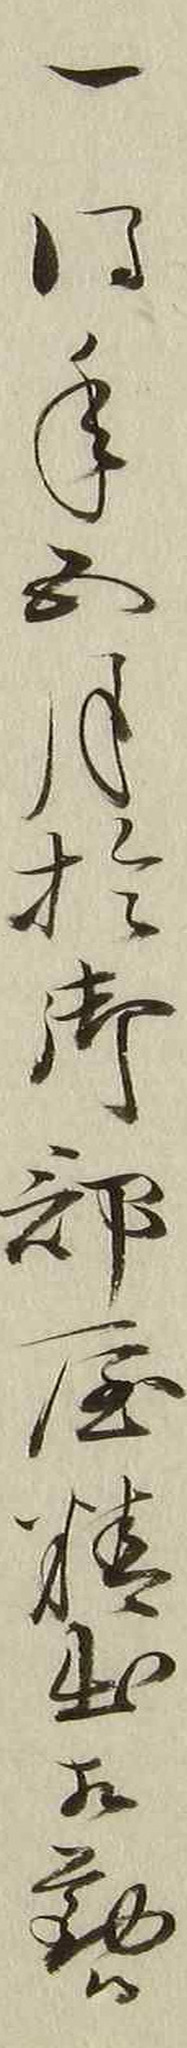一同年五月於御部屈精出相勤候
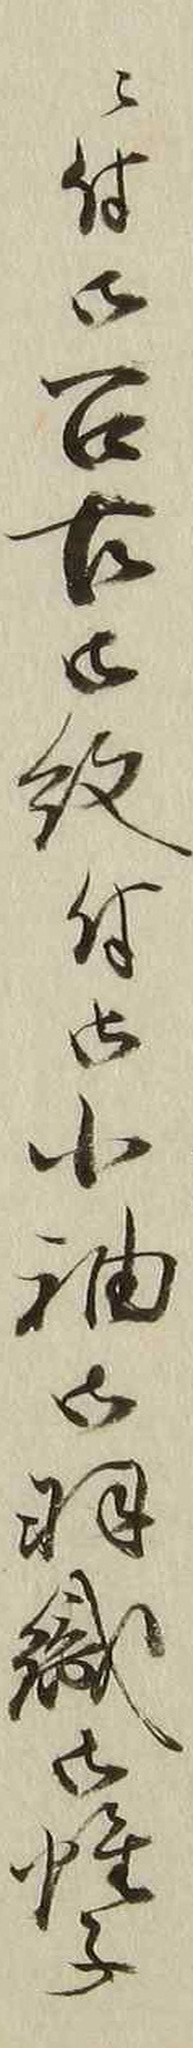に付御召古御紋付御小袖御羽織御帷子
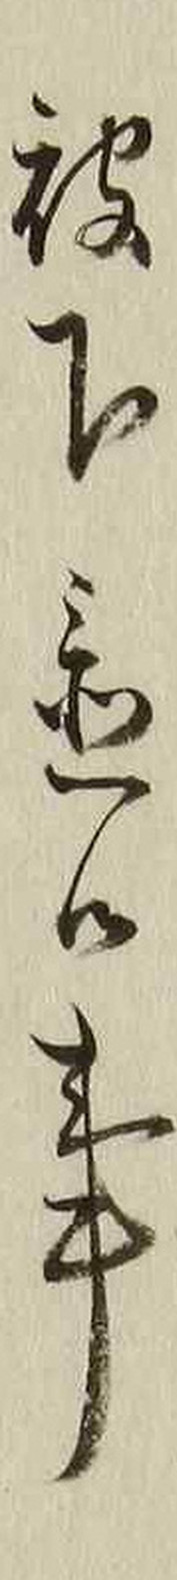被下置候事
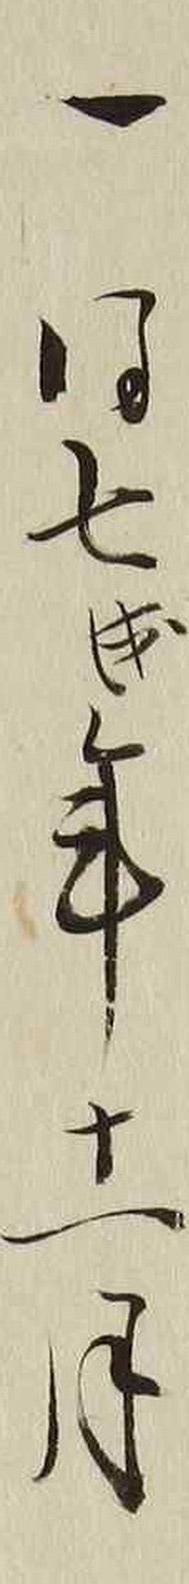一同七戌年十一月
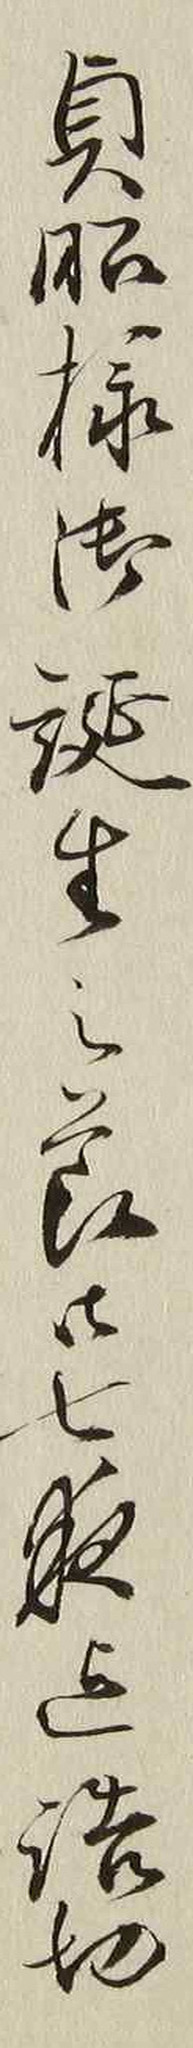貞昭様御誕生之節御七夜迄詰切
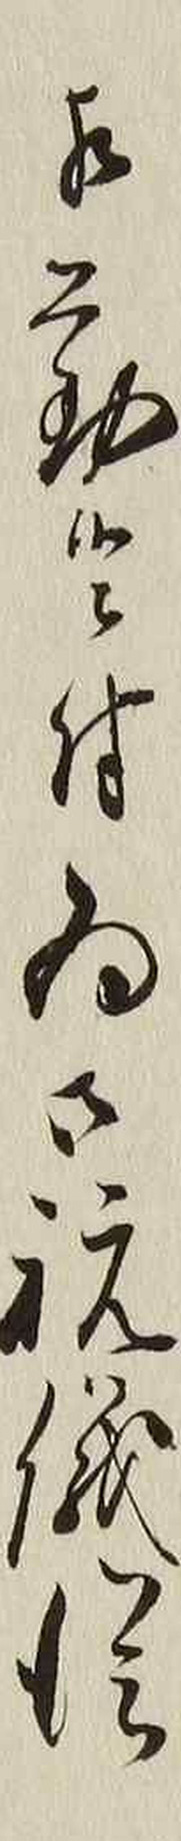相勤候に付為御祝儀従
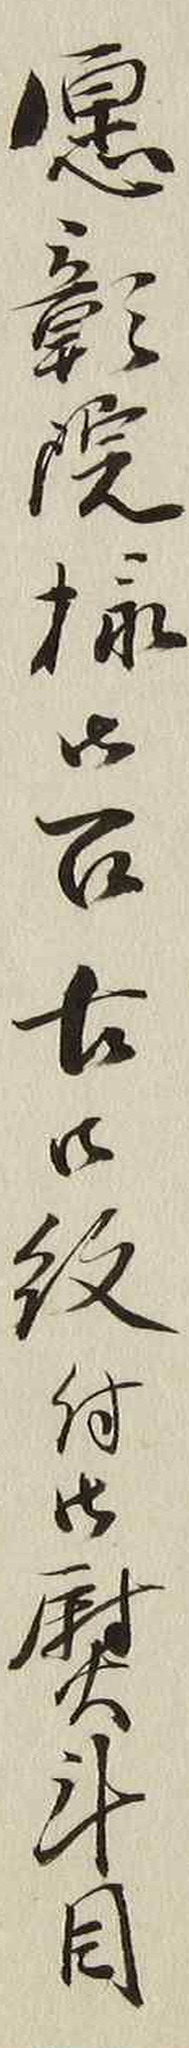愿彰院様御召古御紋付御熨斗目
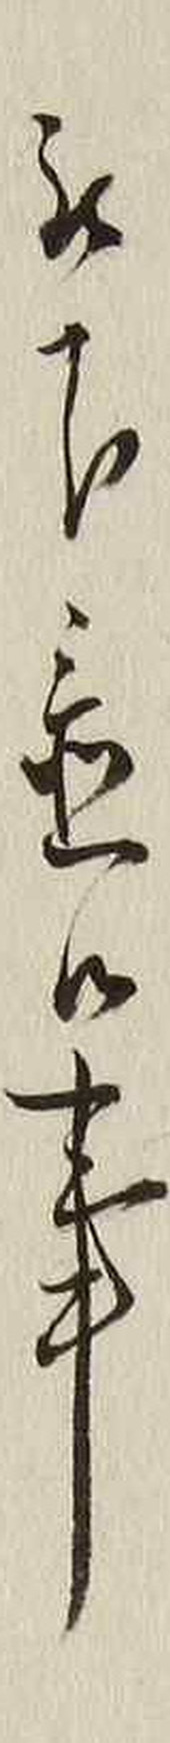被下置候事
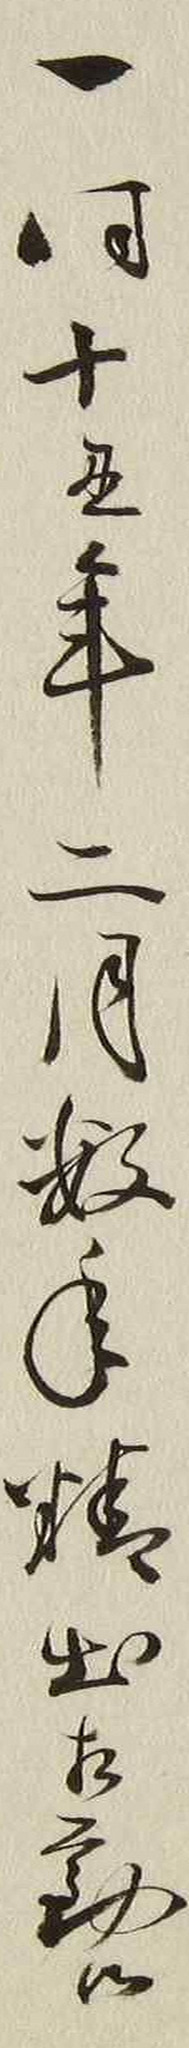一同十丑年二月数年精出相動候
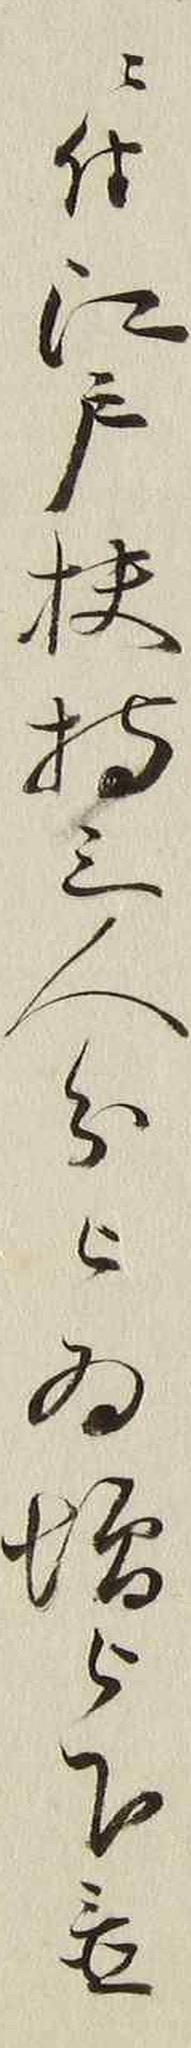に付江戸扶持三人分被為増被下置
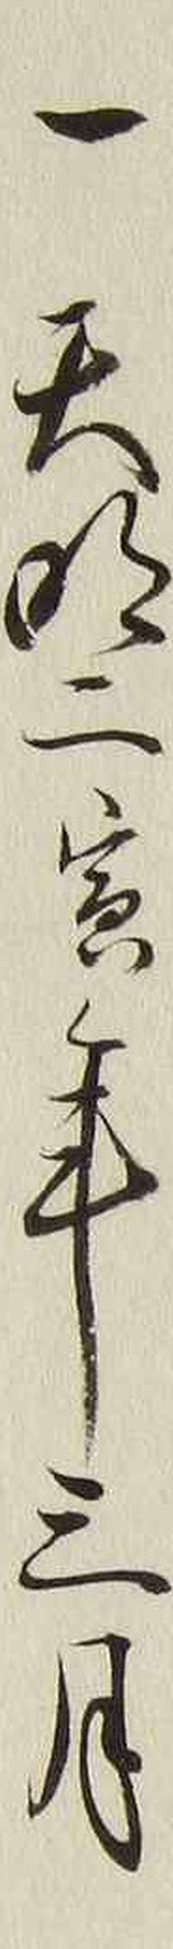一天明二寅年三月
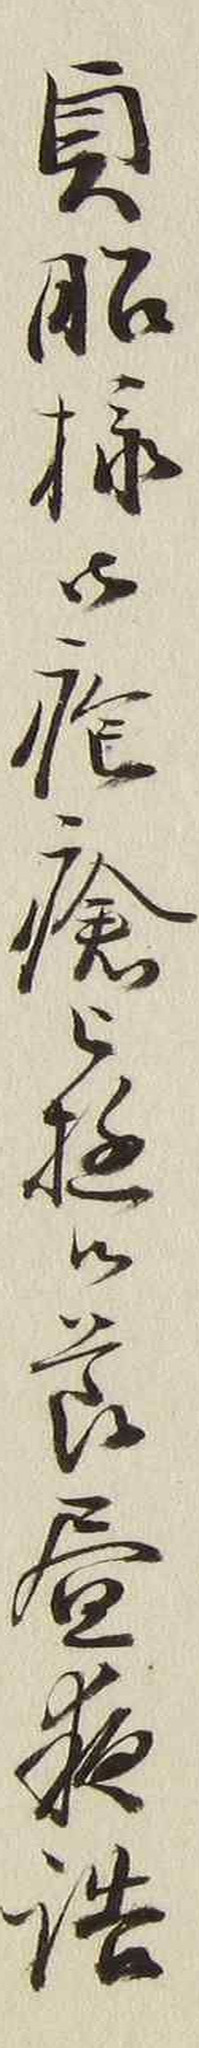貞昭様御疱瘡被遊候節昼夜詰
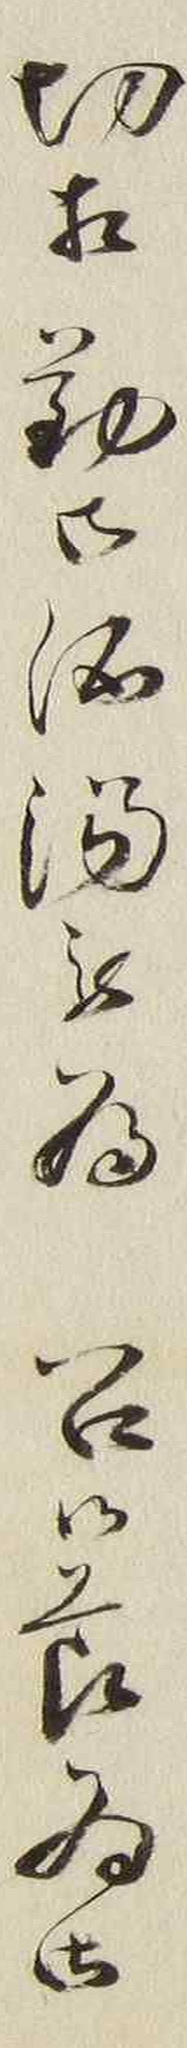切相勤御酒湯被為召候節為御
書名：諸士系譜　巻之157　ね之部1
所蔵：会津若松市立会津図書館
